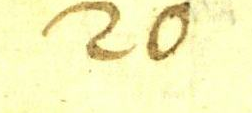20
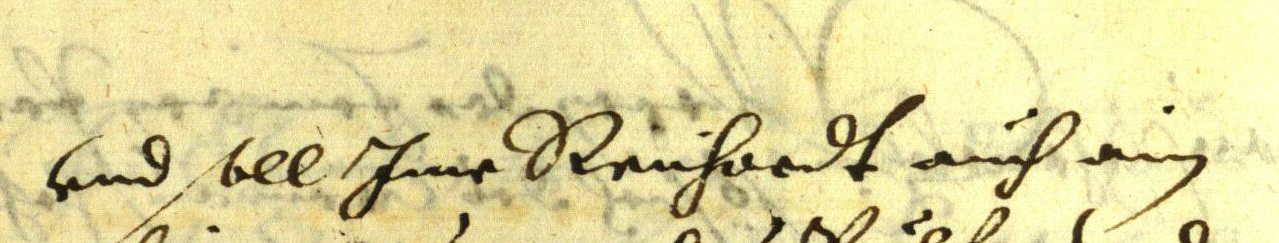vnd soll Ime Reichardt aūch ain
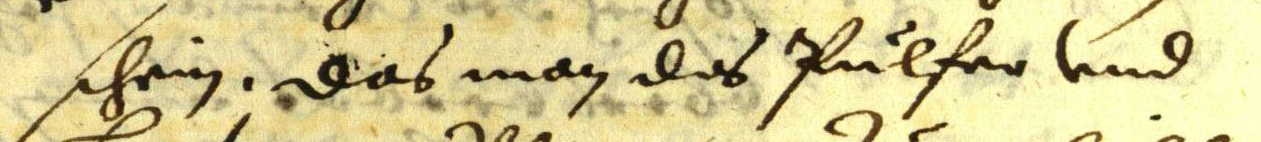schein. das man das Pūlfer vnd
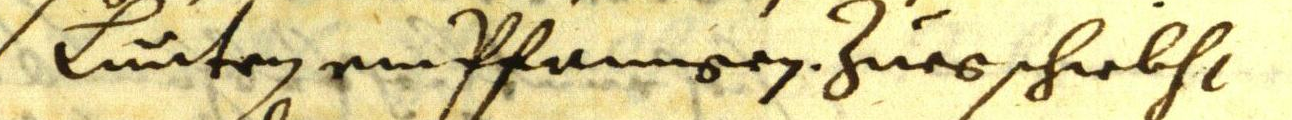Lūnten emPfanngen. Zūegschickht
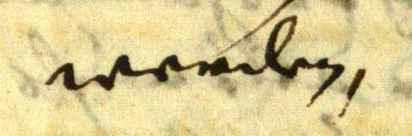werden,
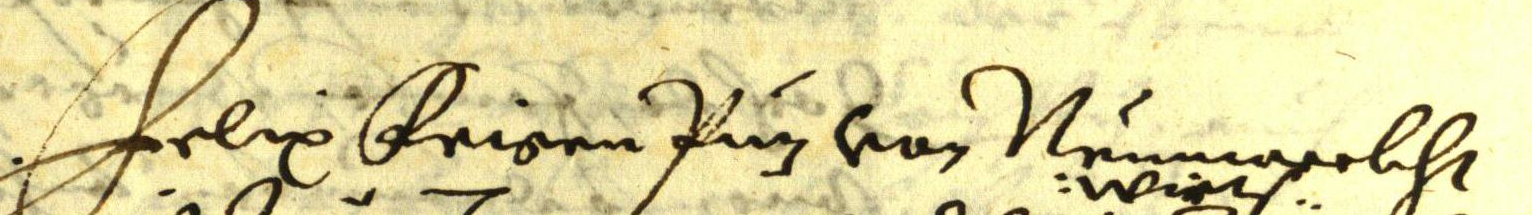Felix Feigen Pūz von Neūmarckht
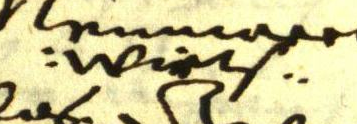:Wirts:
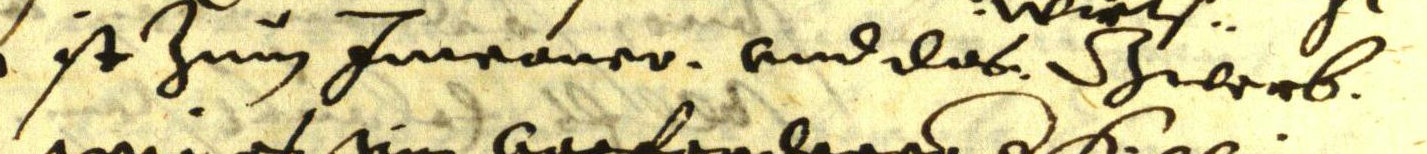ist Zūm Inwoner. und das: Gwerb.
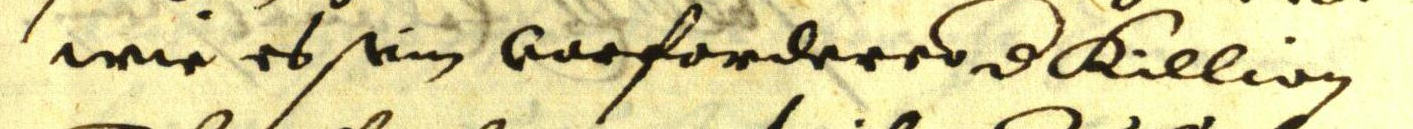wie es sein vorforderer d Killian
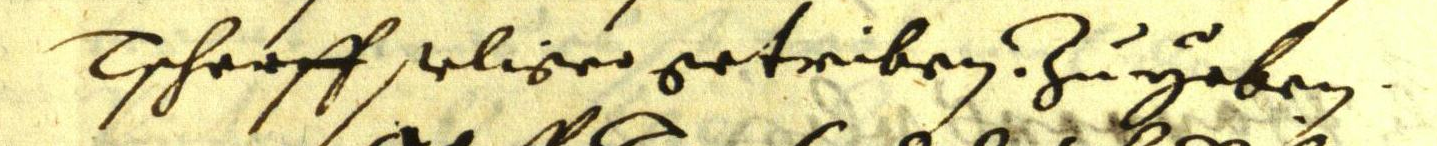Tscherff seliger getriben. Zū ȳeben
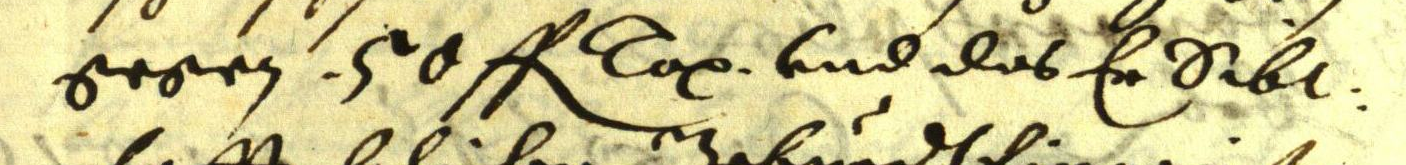gegen. 50 fl Tax. vnd das Er Sibt¬
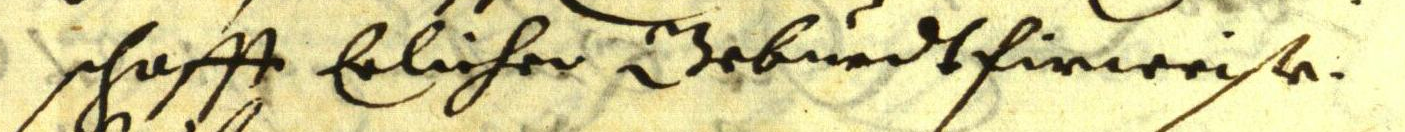schafft Eelicher Gebūrdt firweise.
